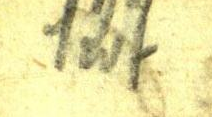127
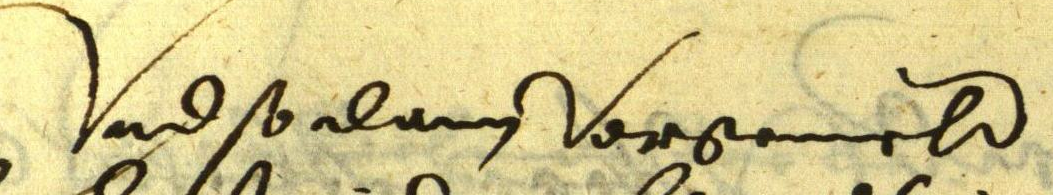Vnd so dann Vorgemelt
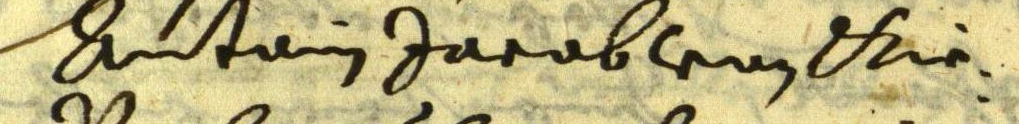Antonj Jacob von Kie¬
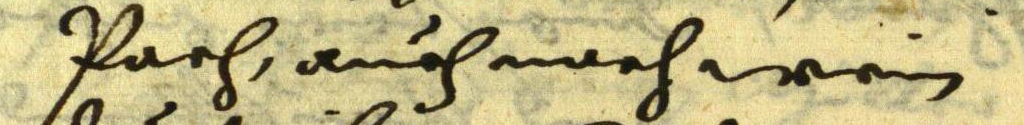Pach, aūch noch wein
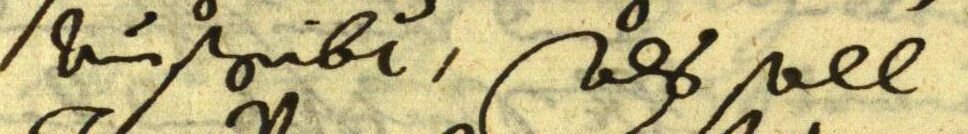Aūsgibt, Als soll
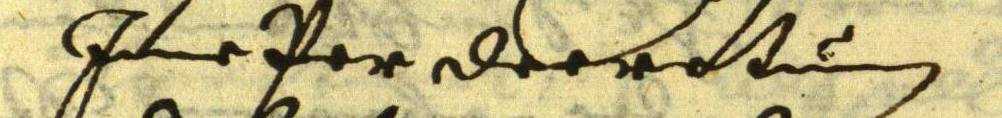Ime Per decretūm
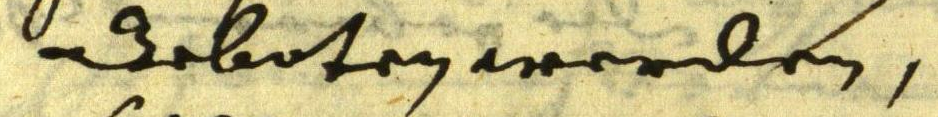Geboten werden,
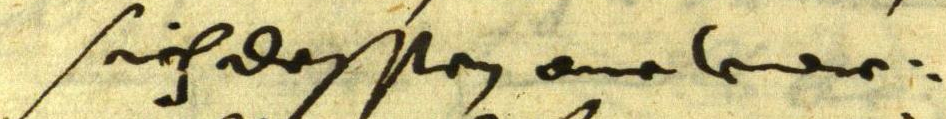sich dessen one vor¬
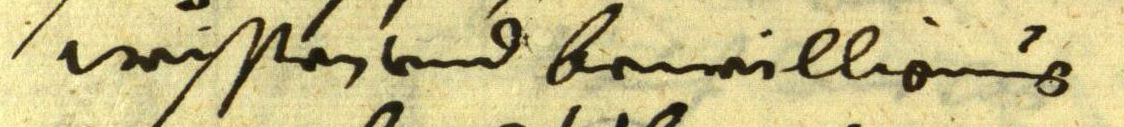wissen vnd bewilligūng
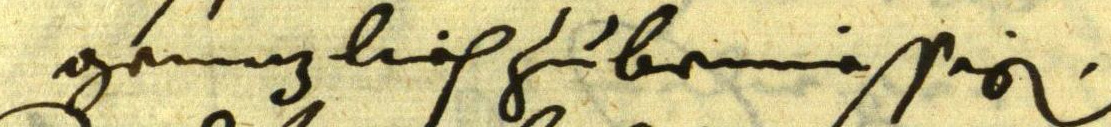gennzlich Zū bemiessig.
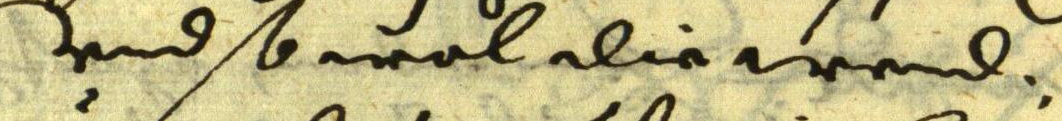vnd so wol die wend¬
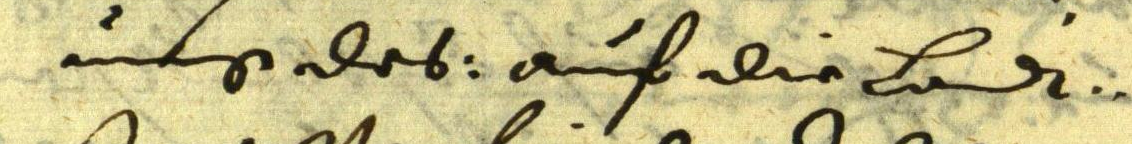ūng des: aūf die Landt¬
